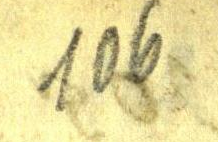106
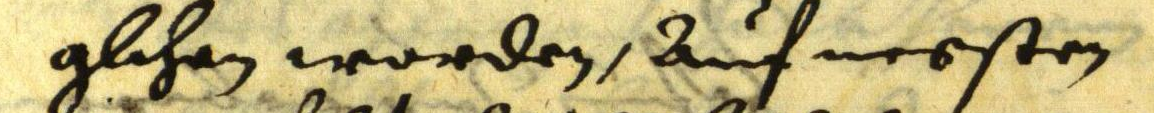glihen worden, Aūf negsten
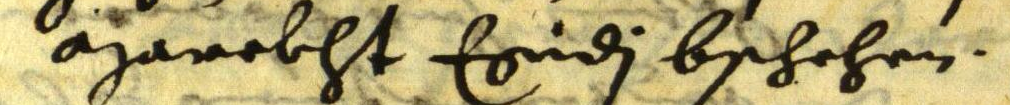Marckht Egidj bschehen.
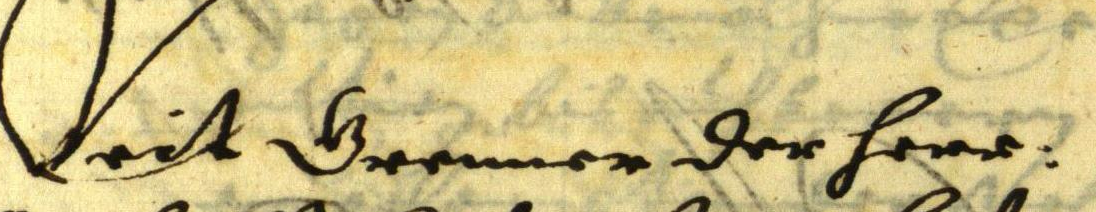Veit Grenner der herr¬
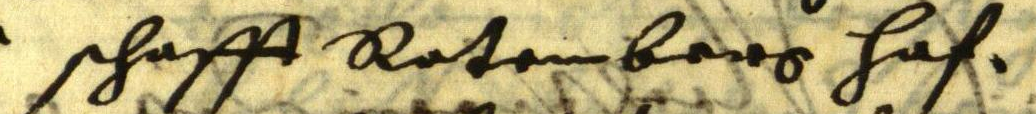schafft Ratemberg Haf¬
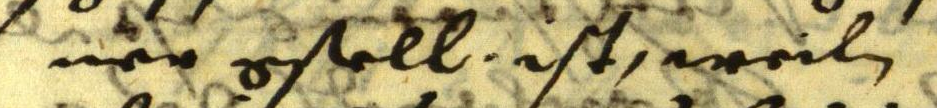ner gsell. ist, weiln
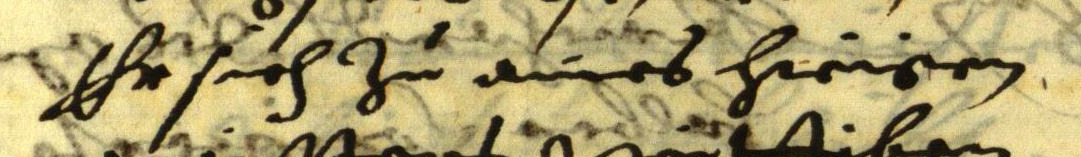Er sich Zū aines hieigen
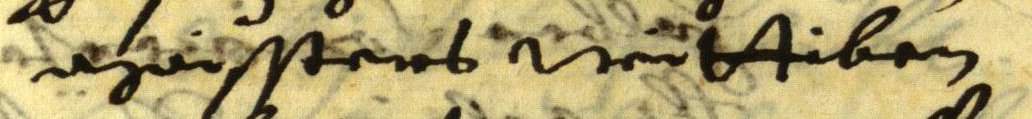Maissters Wittiben
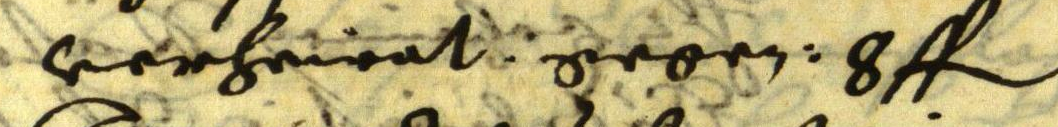verheirat. gegen: 8 fl
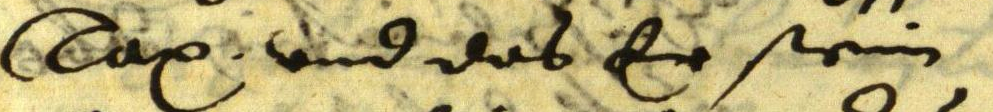Tax. vnd das Er sein
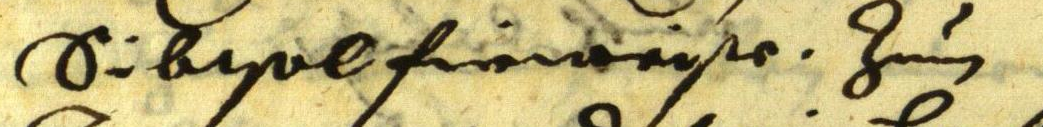Sibtsal firweise. Zūm
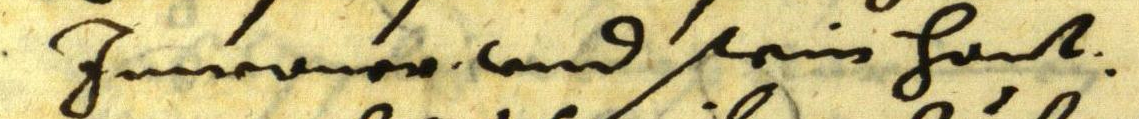Inwoner. vnd sein hant¬
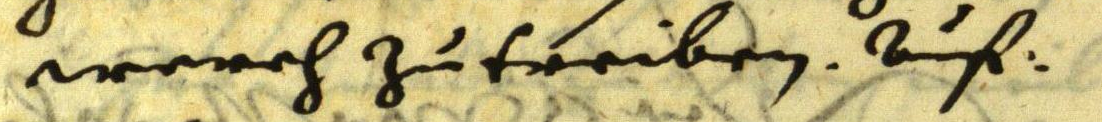werch Zū treiben. Aūf¬
